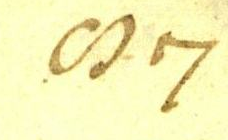87
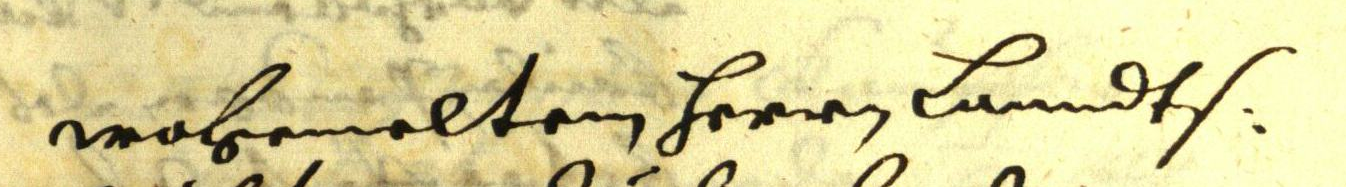wolgemeltem herrn Lanndts¬
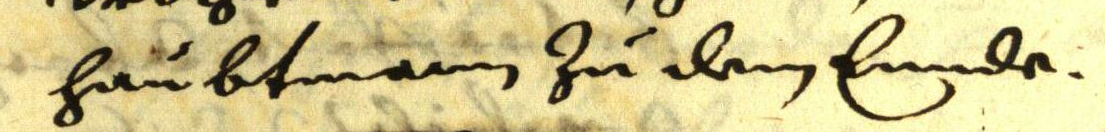haūbtmann Zū dem Ennde.
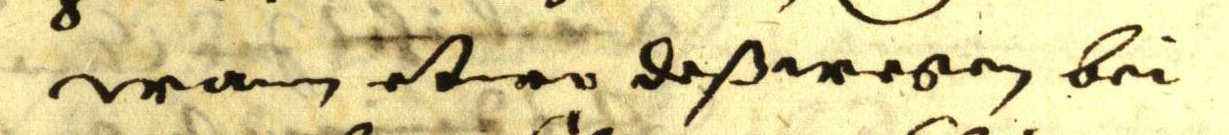wann etwa deßwegen bei
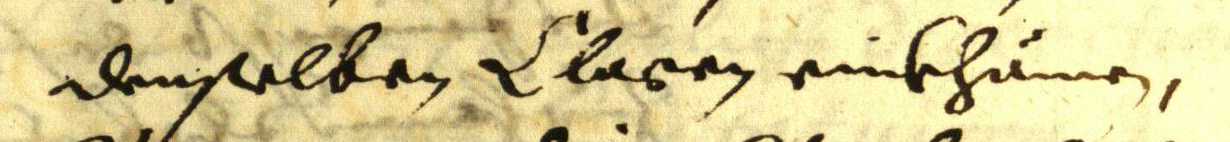demselben Clagen einkhāmen,
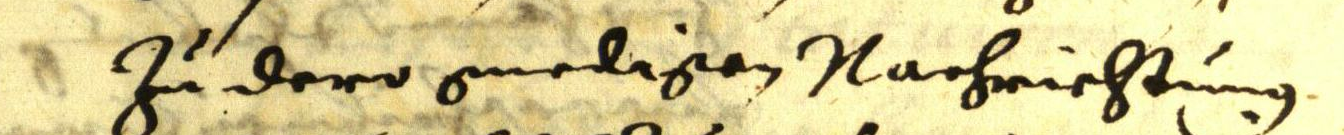Zū dero gnedigen Nachrichtūng
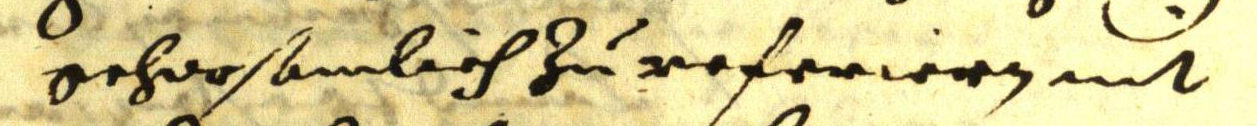gehorsamlich Zū referiern nit
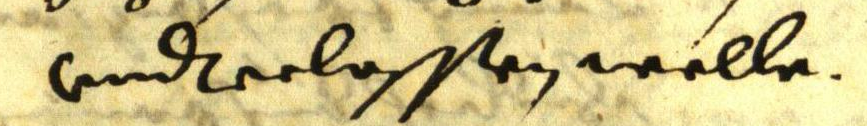vndterlassen welle.
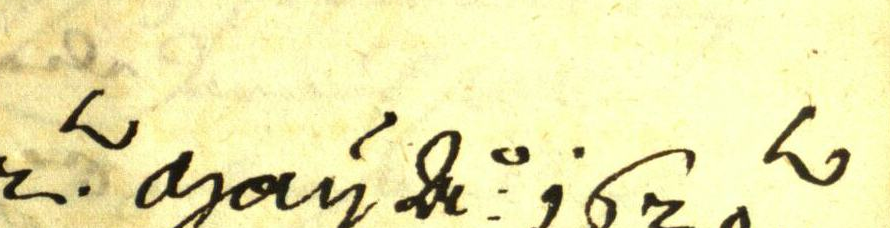t t
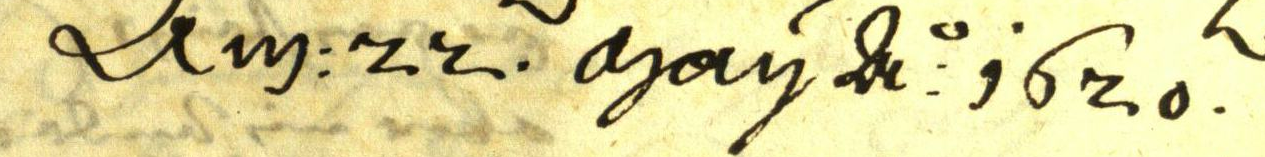Am: 22. Maȳ Ao: 1620.
